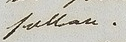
sollen. –
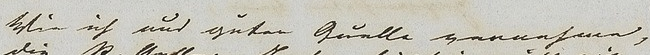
Wie ich aus guter Quelle vernehme,
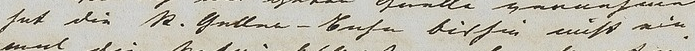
hat die St. Galler-Bahn bishin nicht ein-
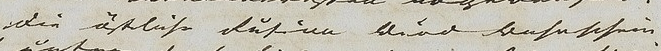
Die östliche Fusion wird wahrschein-
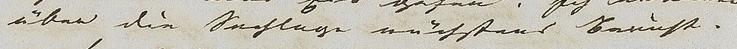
über die Sachlage nächstens Bericht.
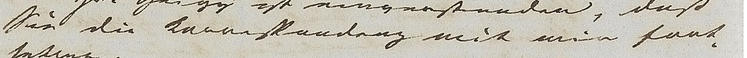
Sie die Korrespondenz mit mir fort-
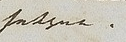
setzen.
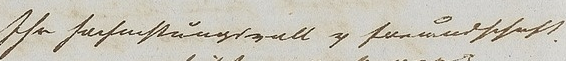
Ihr hochachtungsvoll & freundschaft-
